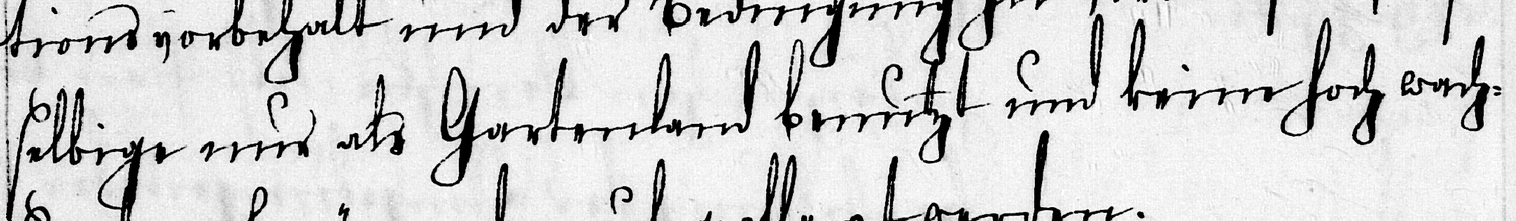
selbige nur als Gartenland benutzt und keine hoch wach¬
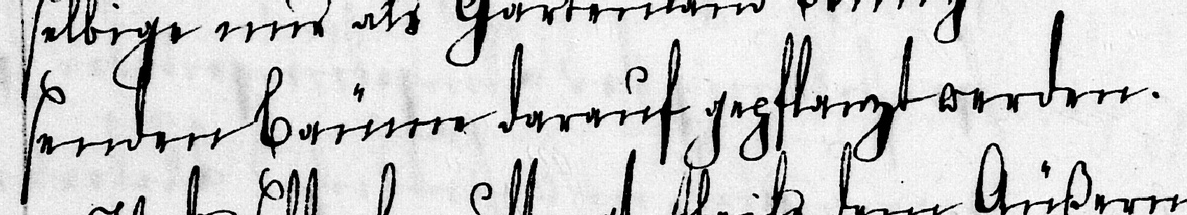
senden Bäume darauf gepflanzt werden.
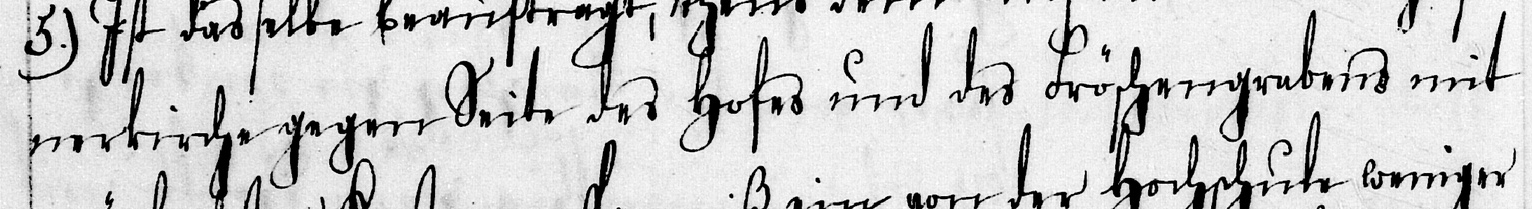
nerkirche gegen Seite des Hofes und des Fröschengrabens mit
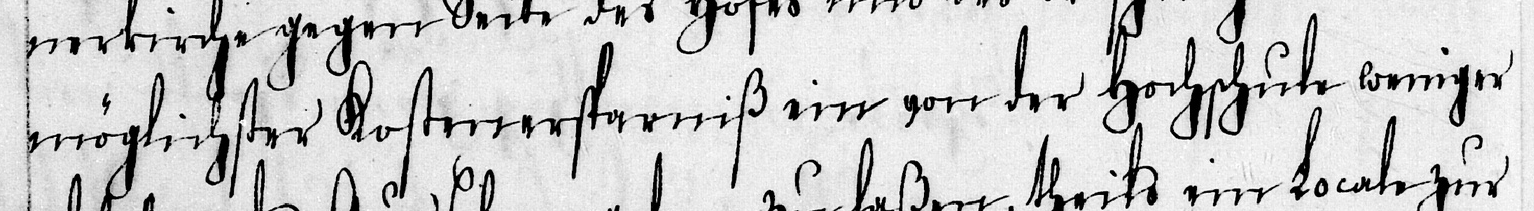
möglichster Kostenersparniß ein von der Hochschule weniger
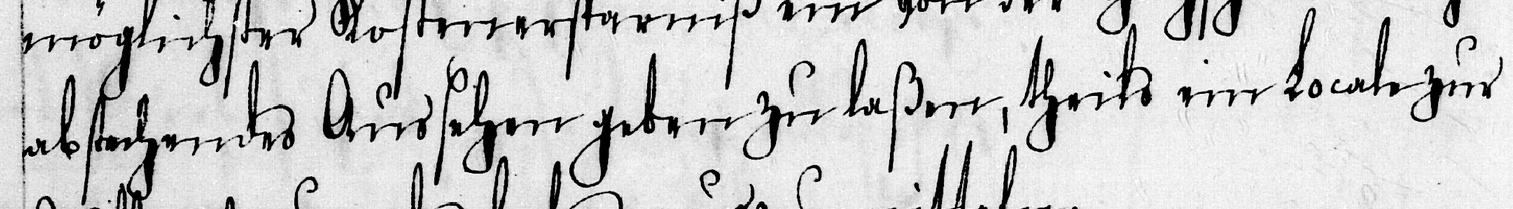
abstehendes Aussehen geben zu laßen, theils ein Locale zur
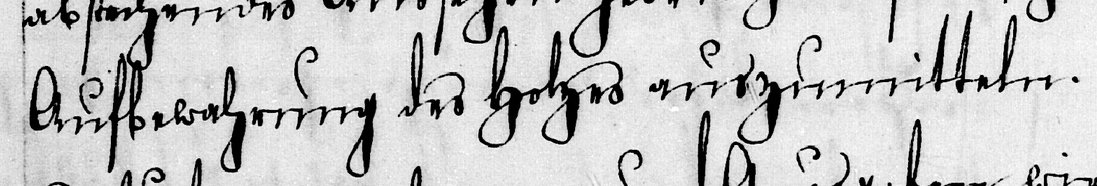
Aufbewahrung des Holzes auszumittteln.
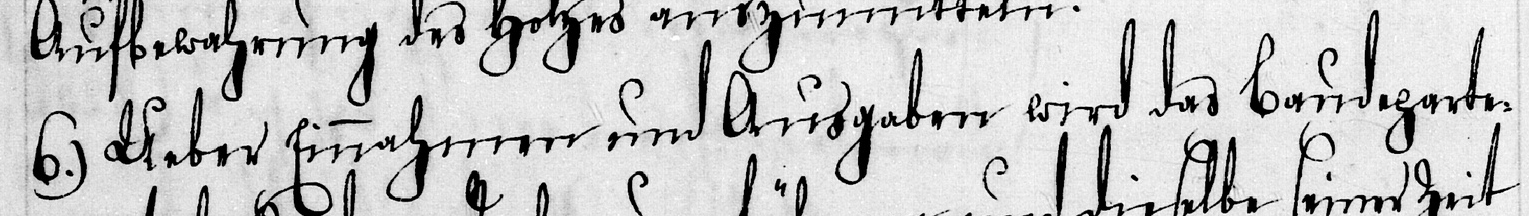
6.) Ueber Einnahmen und Ausgaben wird das Baudeparte¬
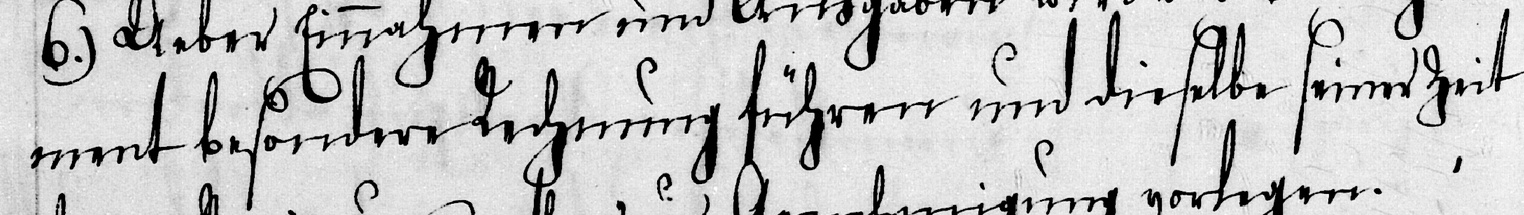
ment besondere Rechnung führen und dieselbe seiner
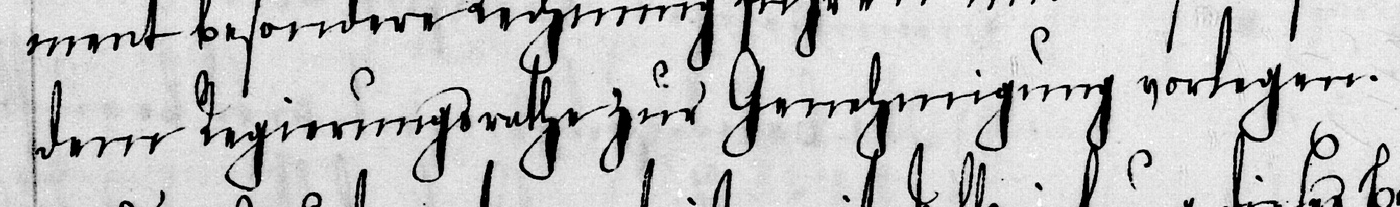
dem Regierungsrathe zur Genehmigung vorlegen.
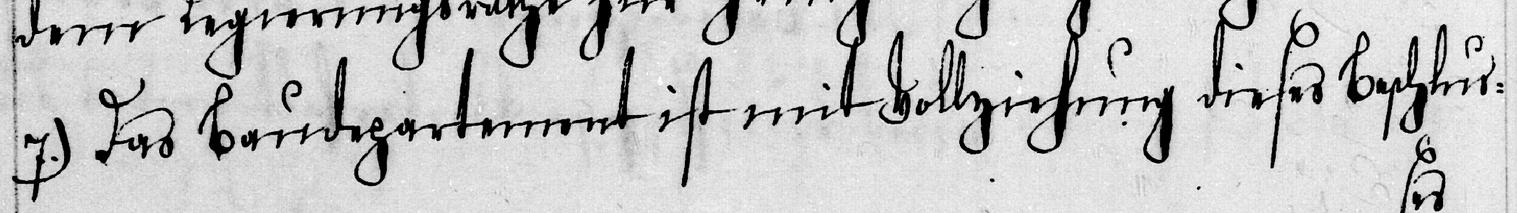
7.) Das Baudepartement ist mit Vollziehung dieses Beschlu¬
